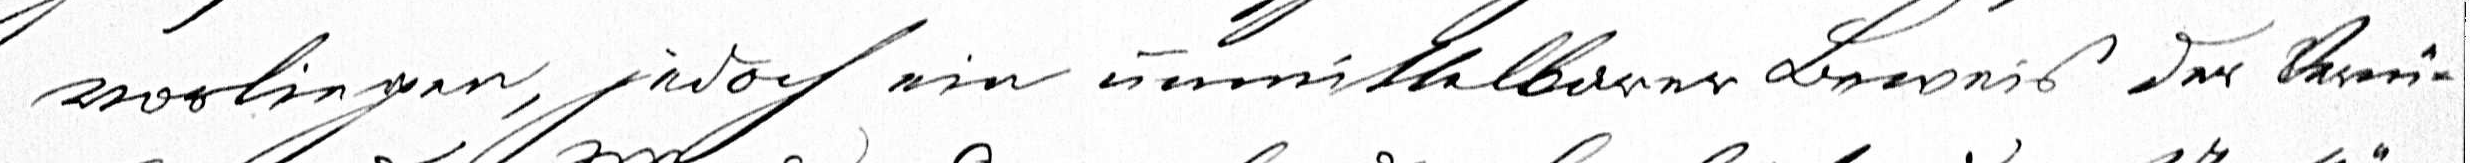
vorliegen, jedoch ein unmittelbarer Beweis der Verü¬
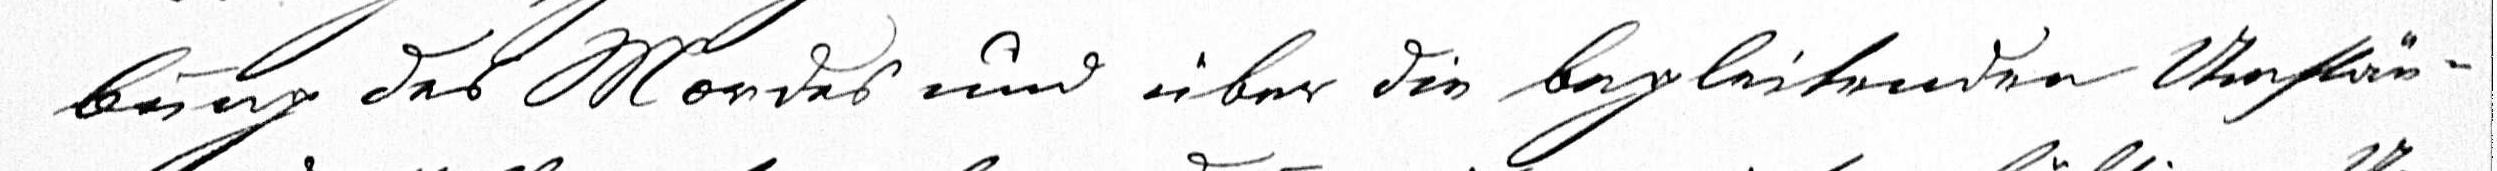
bung des Mordes und über die begleitenden Umstän¬
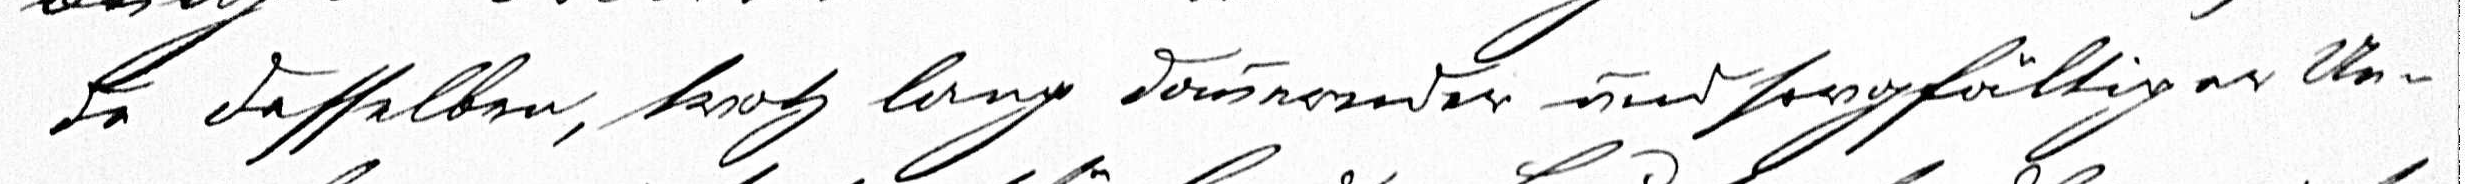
de desselben, trotz lang dauernder und sorgfältiger Un¬
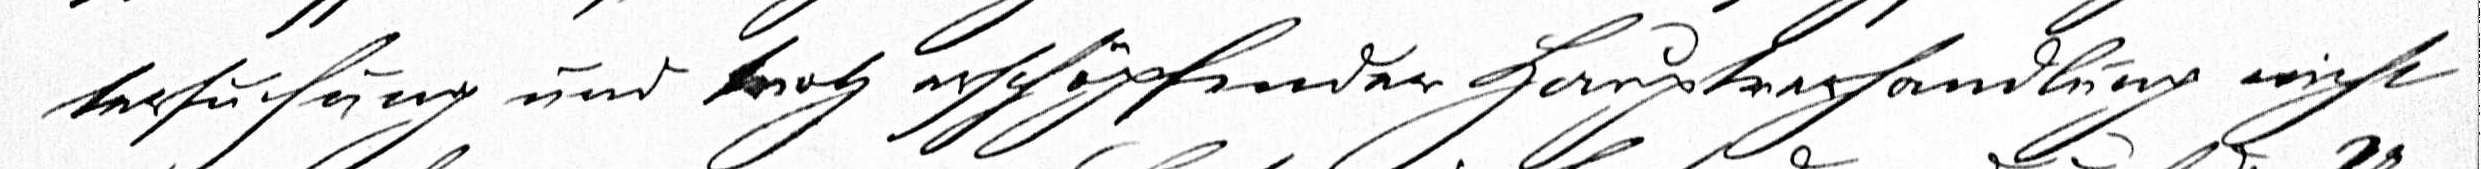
tersuchung und trotz erschöpfender Hauptverhandlung nicht
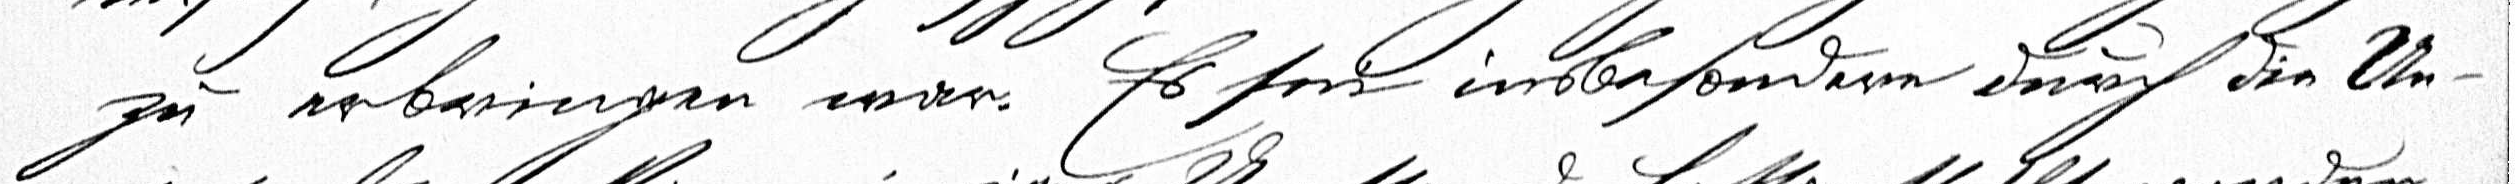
zu erbringen war. Es sei insbesondere durch die Un¬
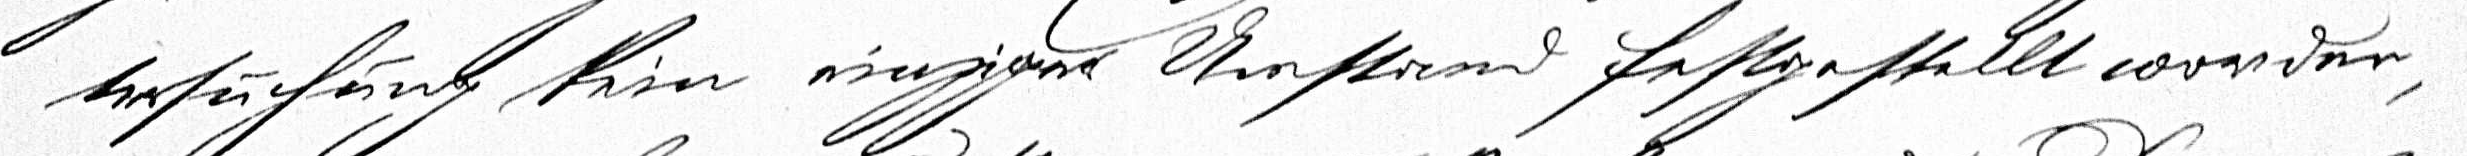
tersuchung kein einziger Umstand festgestellt worden,
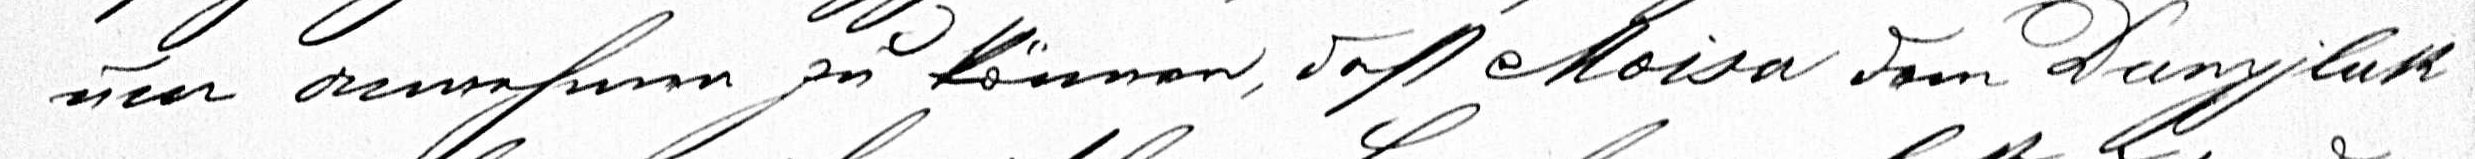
um annehmen zu können, daß Moisa dem Danyjluk
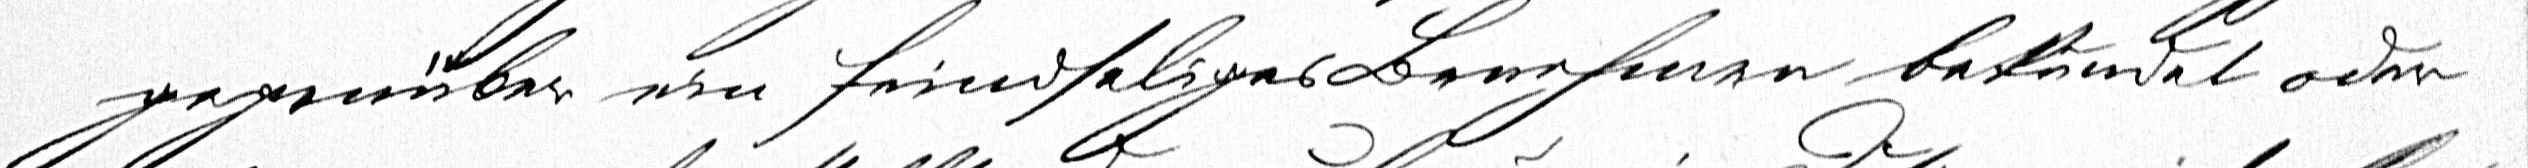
gegenüber ein feindseliges Benehmen bekundet oder
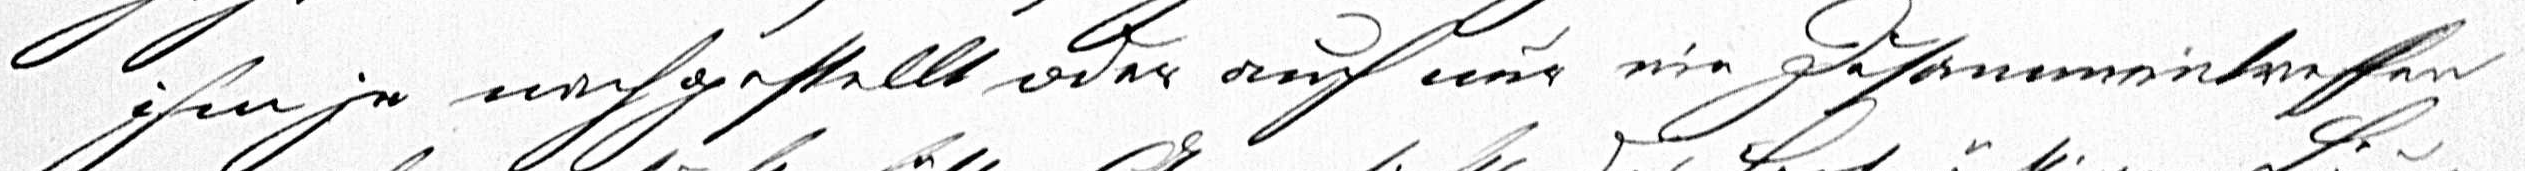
ihm je nachgestellt oder auch nur ein Zusammeneintreffen
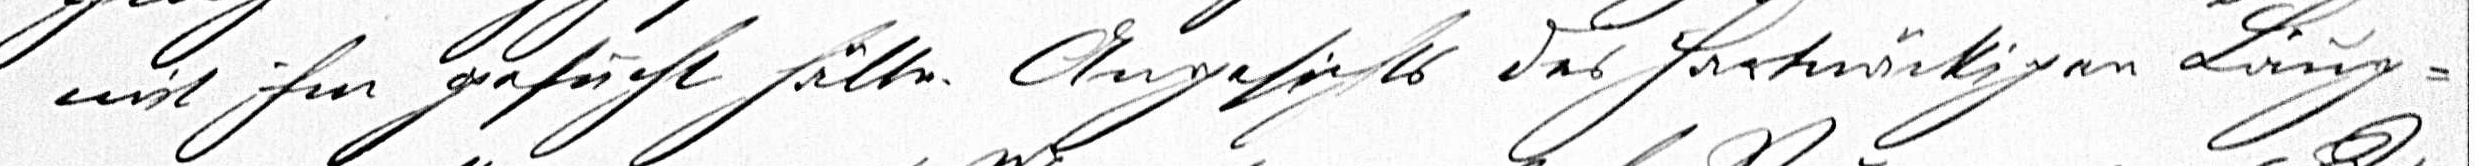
mit ihm gesucht hätte. Angesichts des Hartnäckigen Läug¬
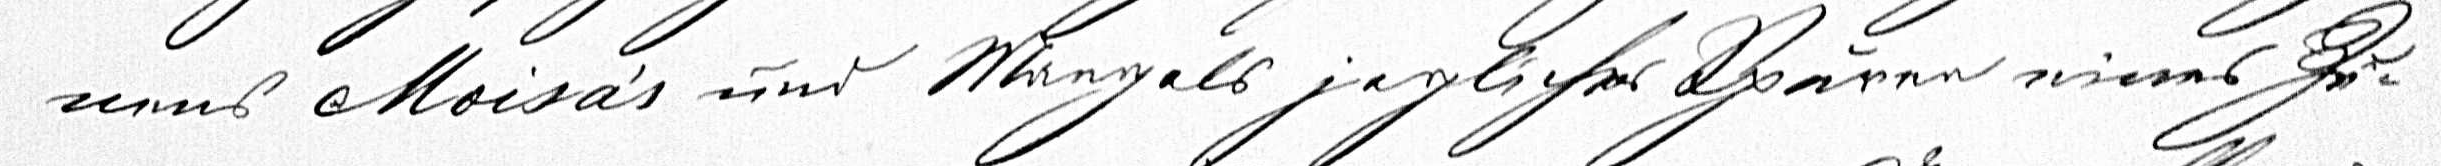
nens Moisa’s und Mangels jeglicher Spuren eines Zu¬
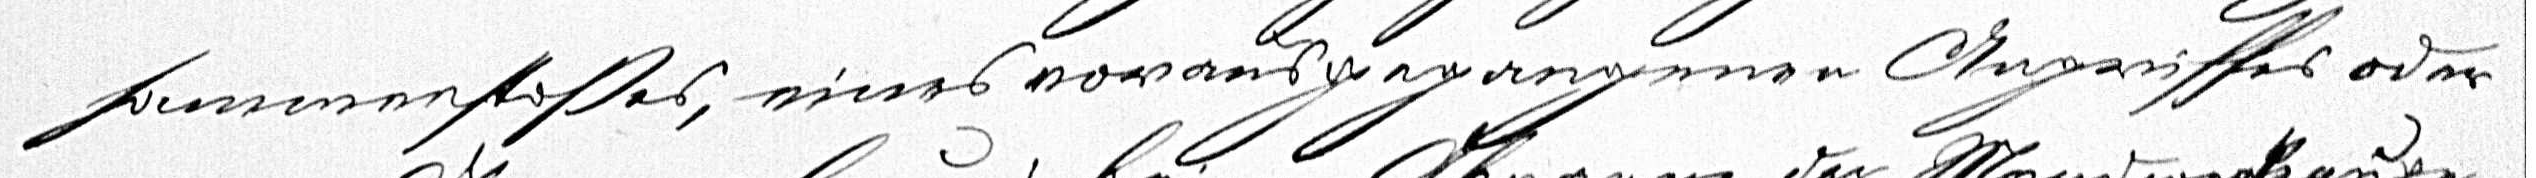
sammenstoßes, eines vorausgegangenen Angriffes oder
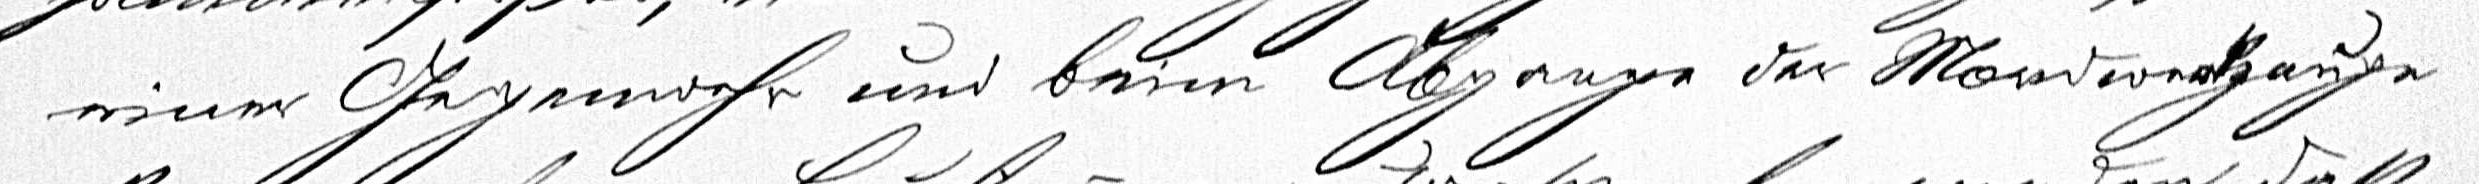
einer Gegenwehr und beim Abgange der Mordwerkzeuge
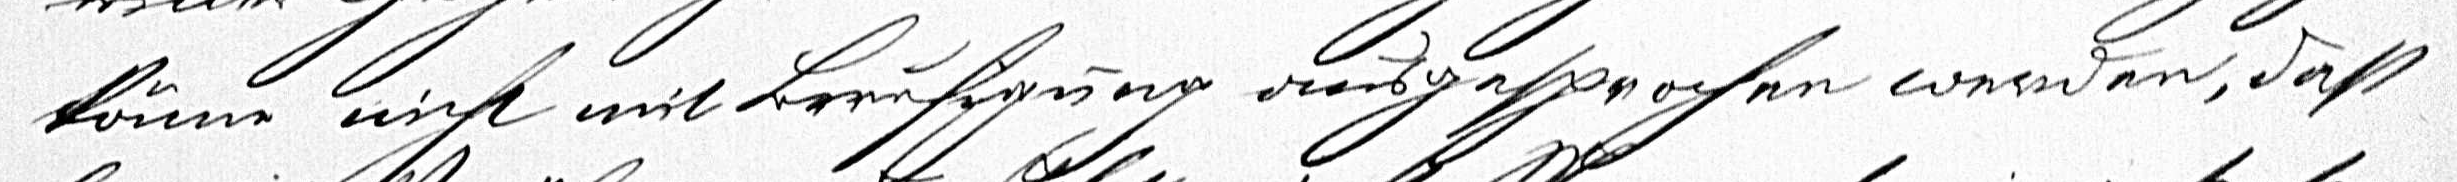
könne nicht mit Beruhigung ausgesprochen werden, daß
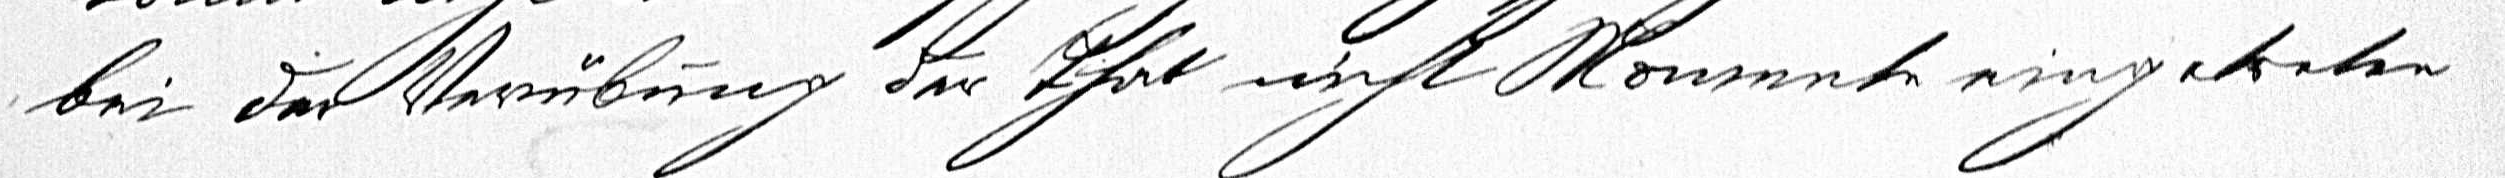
bei der Verübung der That nicht Momente eingetreten
